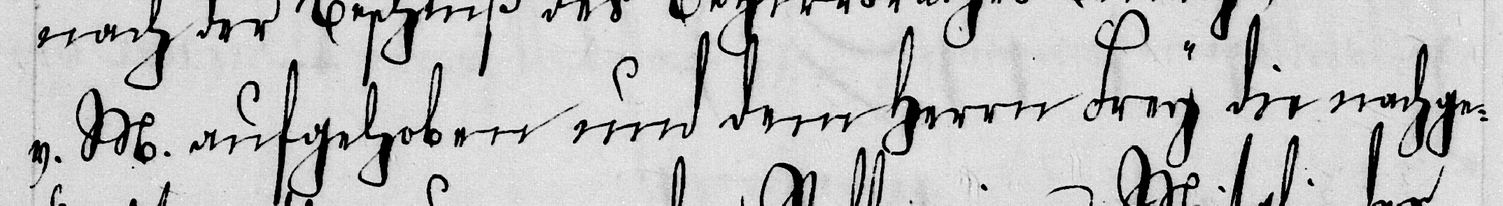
v. M. aufgehoben und dem Herrn Frey die nachge¬
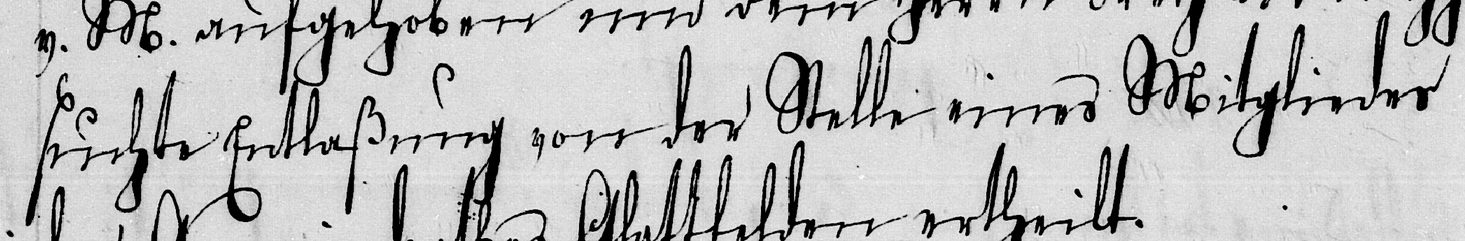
suchte Entlaßung von der Stelle eines Mitgliedes
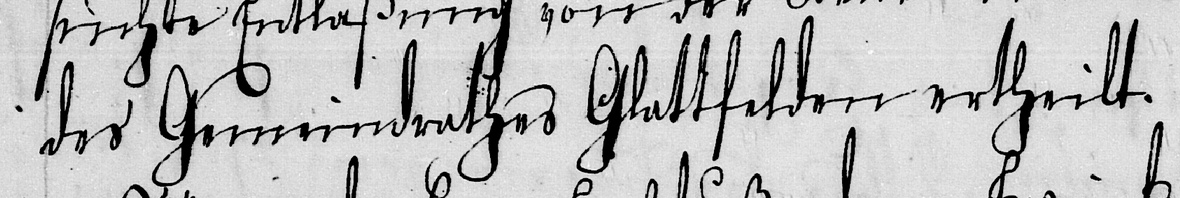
des Gemeindrathes Glattfelden ertheilt.
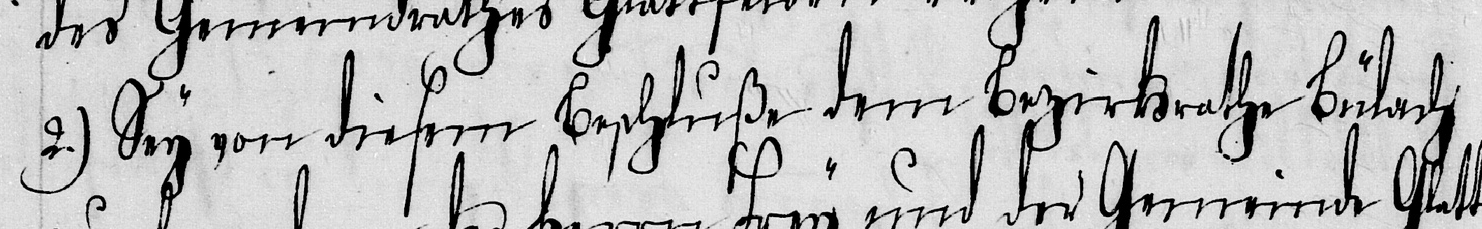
2.) Sey von diesem Beschluße dem Bezirksrathe Bülach
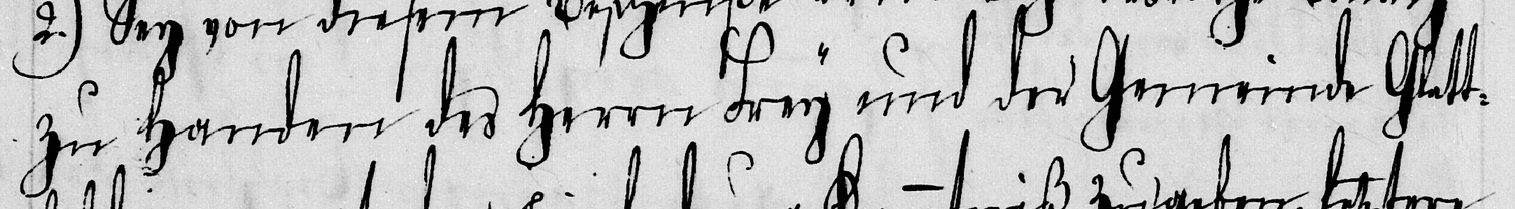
zu Handen des Herrn Frey und der Gemeinde Glat¬
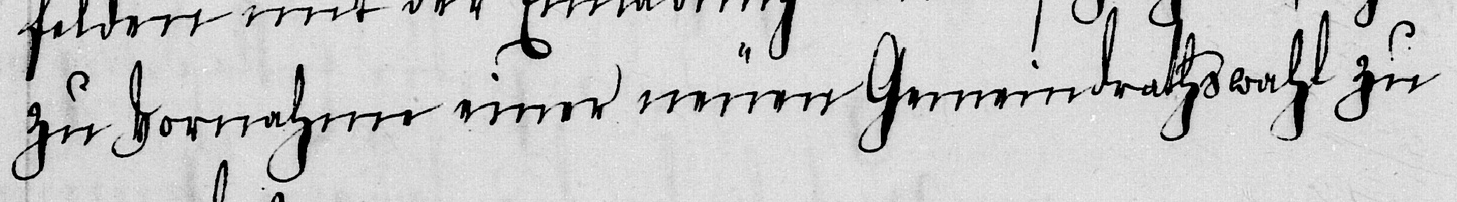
zu Vornahme einer neuen Gemeindrathswahl zu
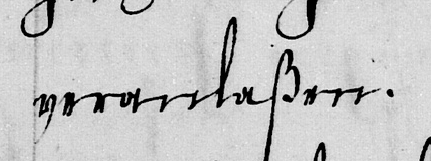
veranlaßen.
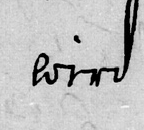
wird;
